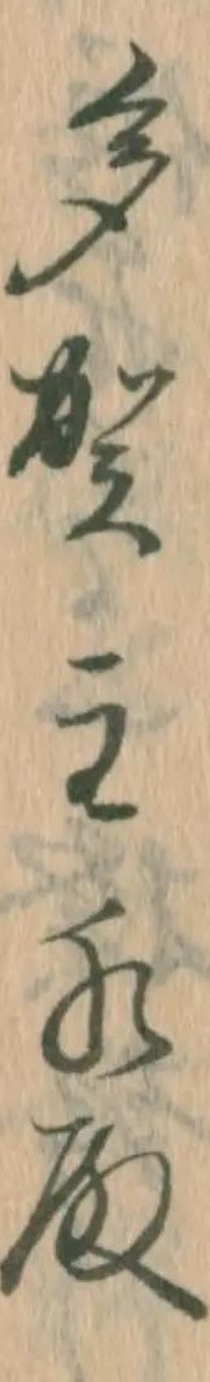多賀主水殿
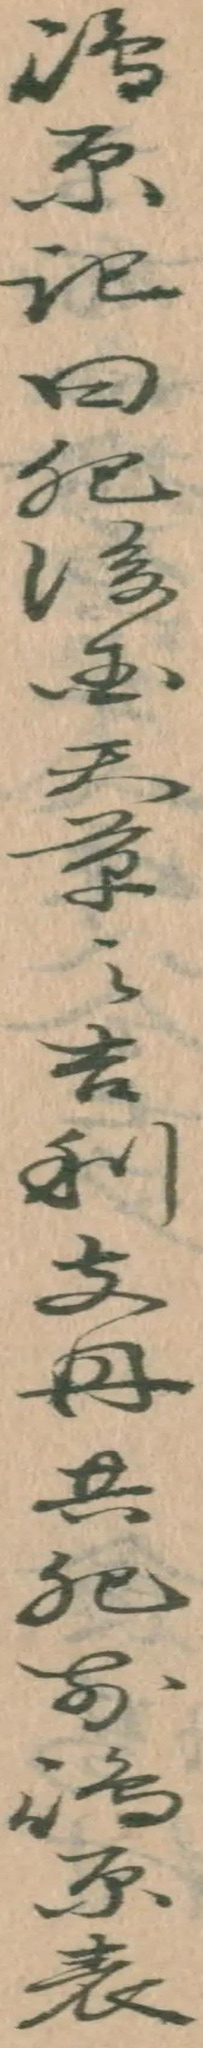島原記日肥後国天草之吉利支丹共肥前島原表
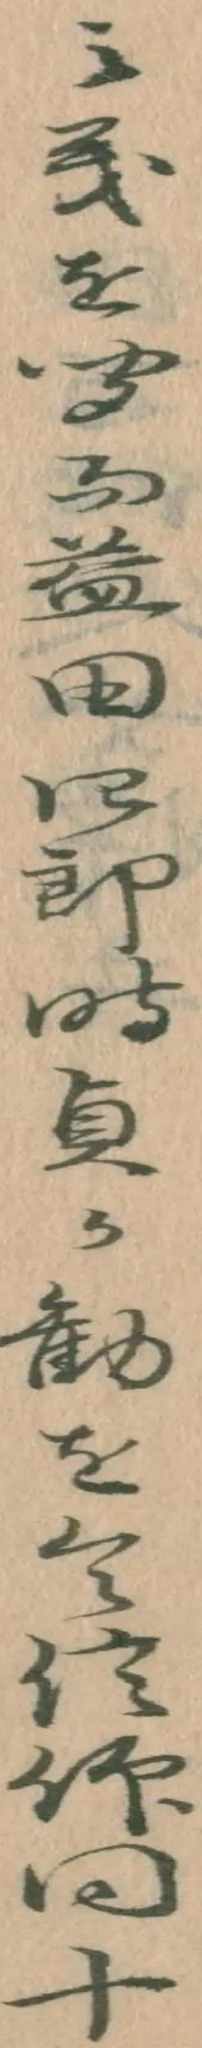之義を聞而益田四郎時貞か勧を令信仰同十
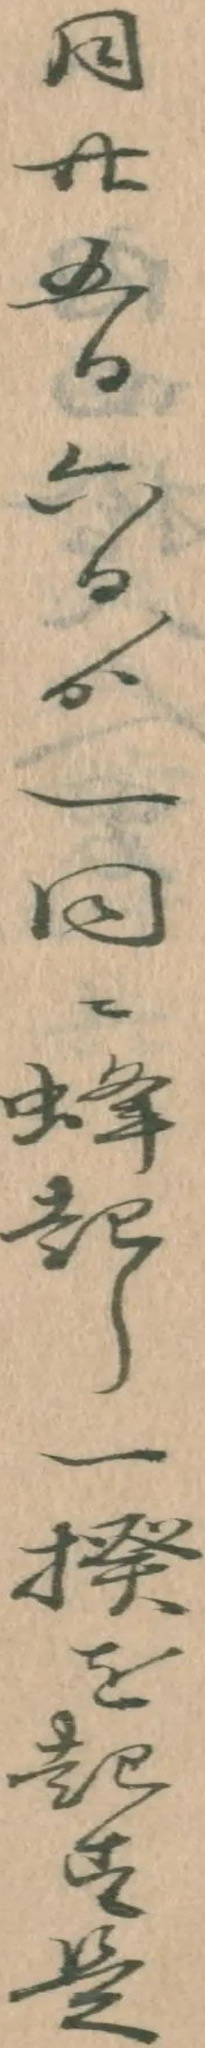月廿五日六日ゟ一同に蜂起し一揆を起す是
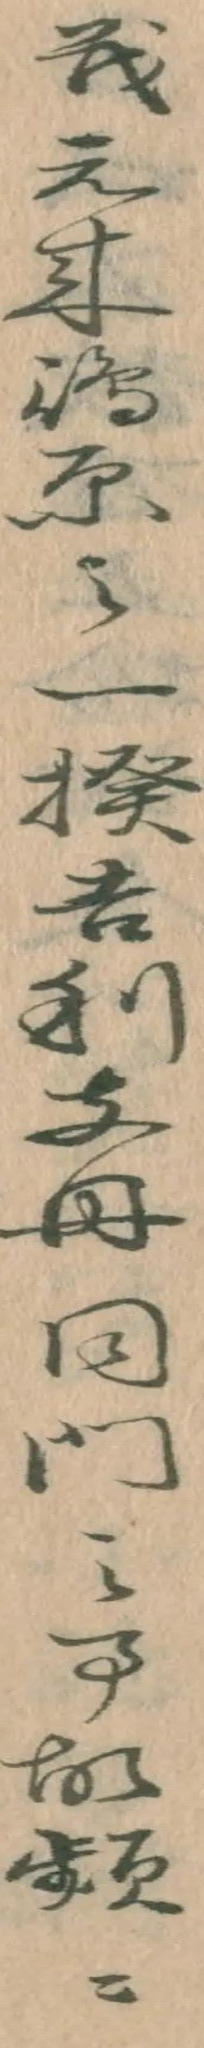も元来島原之一揆吉利支丹同門之事故頻に
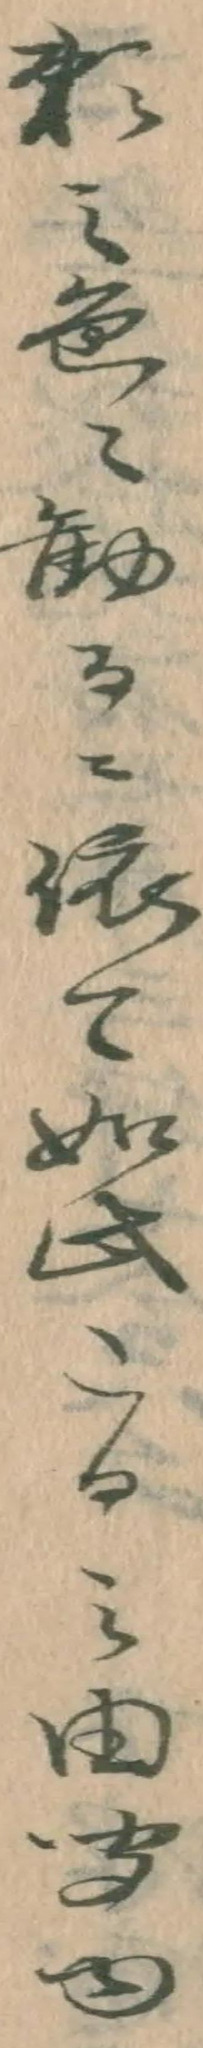頼之色々勧るに依て如此たる之由聞内
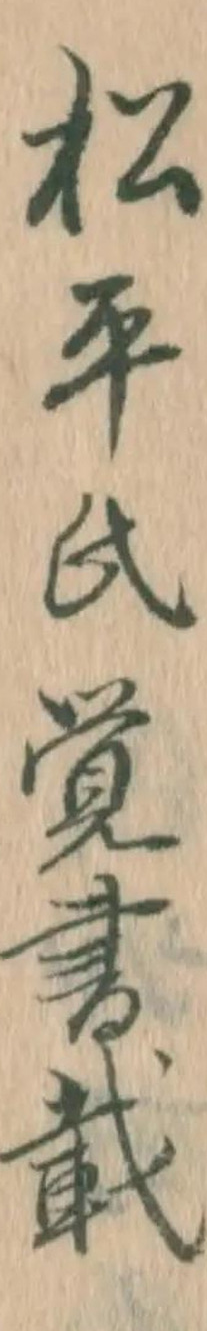松平氏覚書載
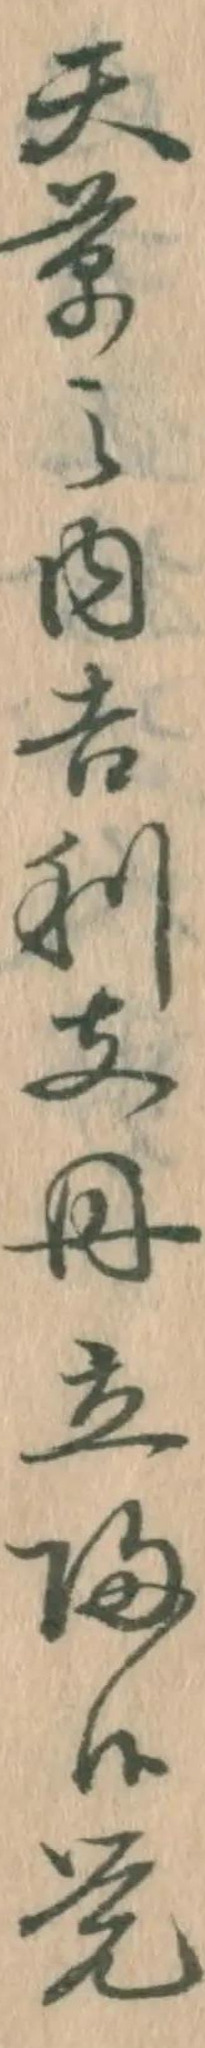天草之内吉利支丹立帰候覚
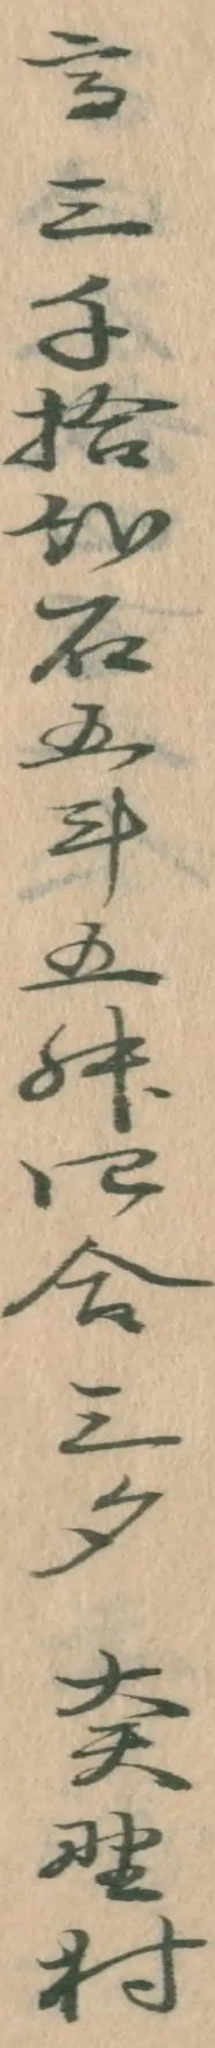高三千拾弐石五斗五升四合三勺大矢野村
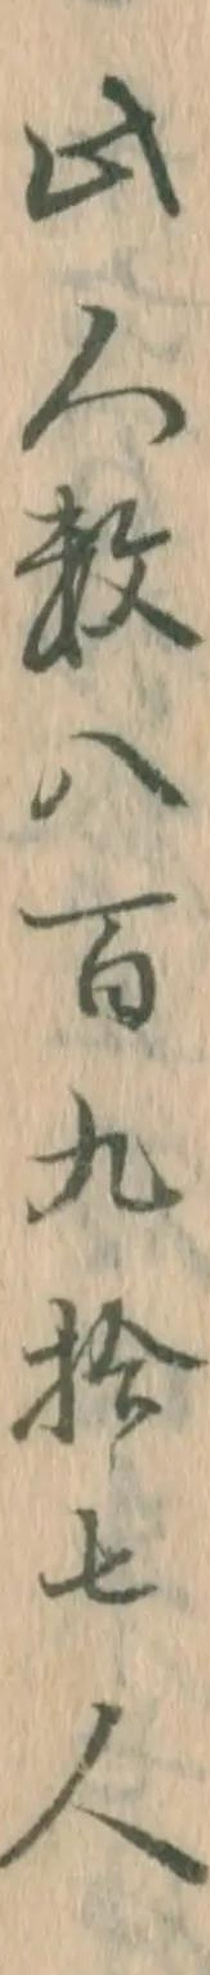此人数八百九拾七人
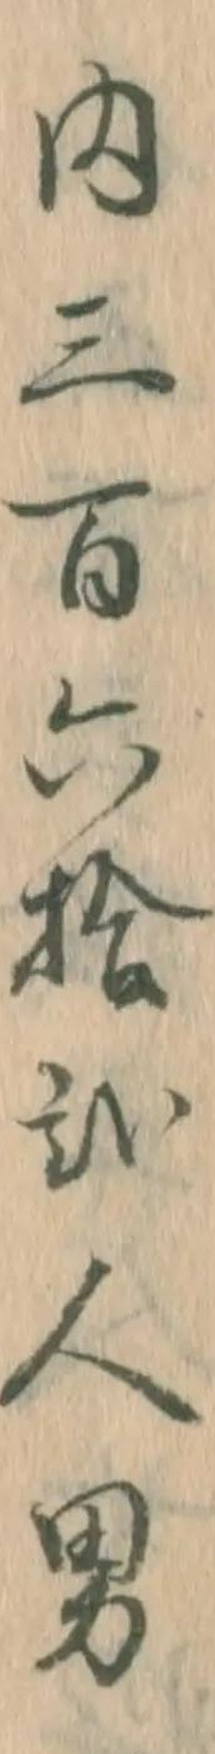内三百六拾弐人男

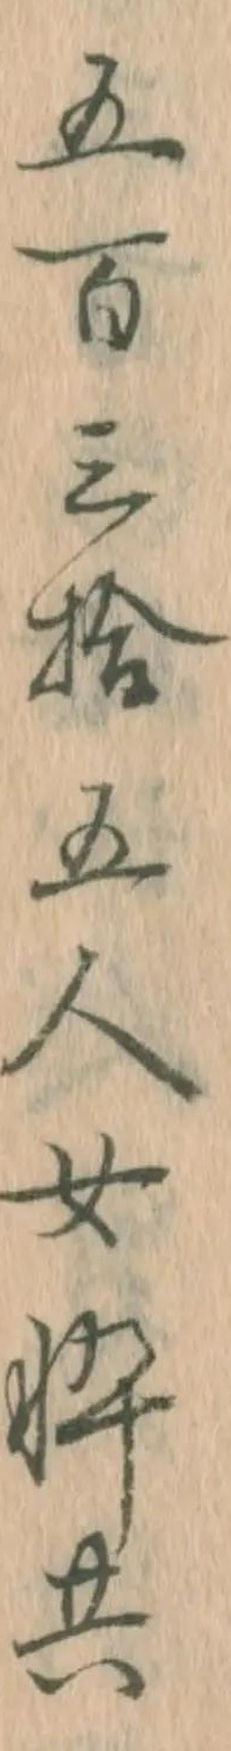五百三拾五人女忰共
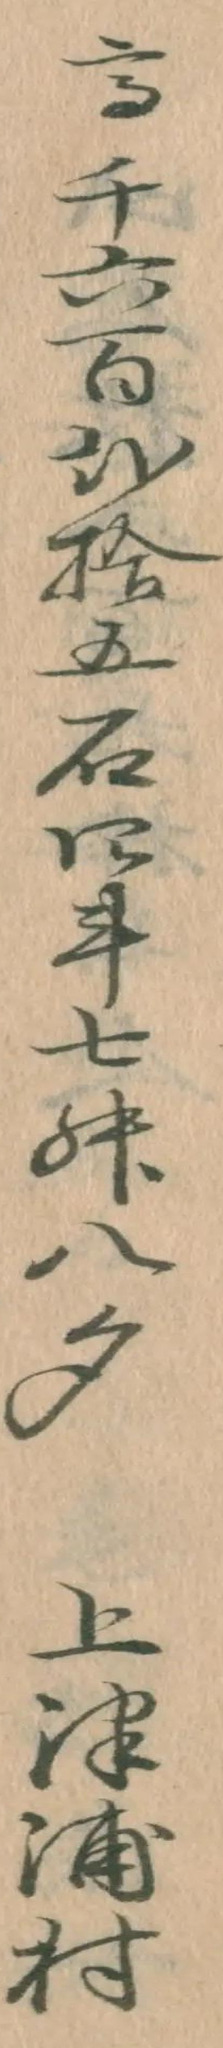高千六百弐拾五石四斗七升八勺上津浦村
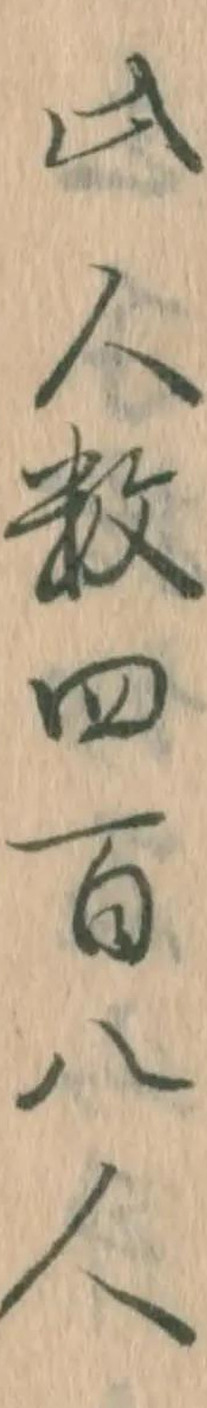此人数四百八人
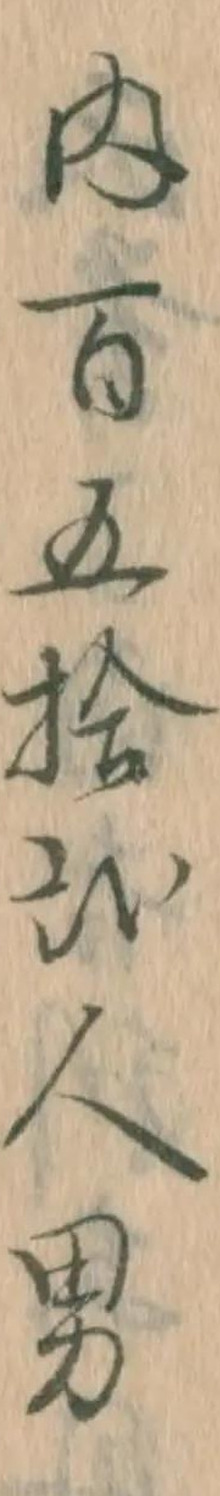内百五拾弐人男
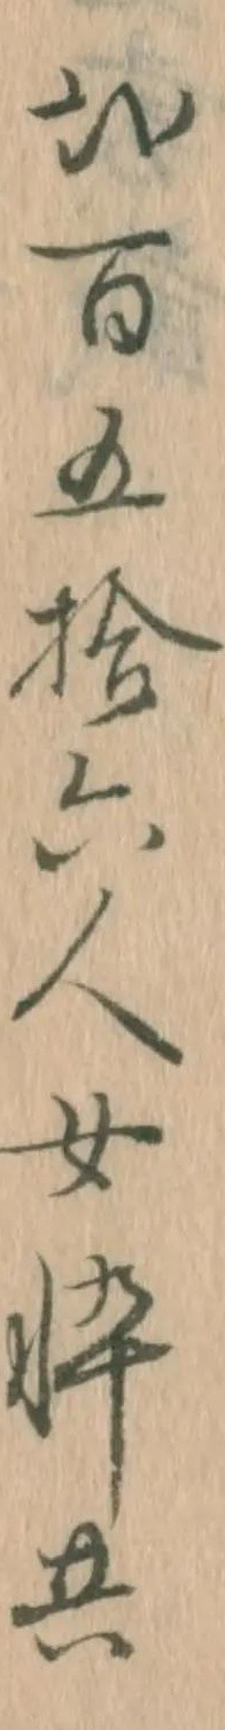弐百五拾六人女忰共
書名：切支丹御退治記 49巻. [1]
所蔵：国立国会図書館 National Diet Library, JAPAN
